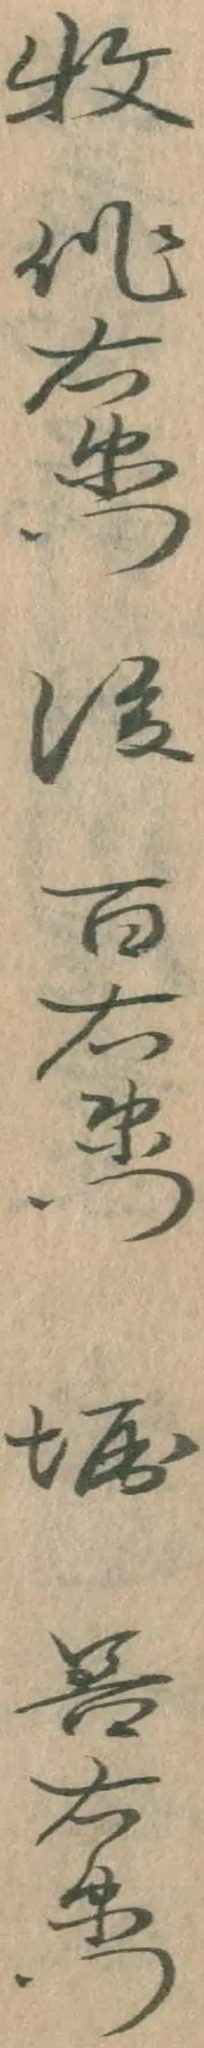牧作右衛門後百右衛門堀善右衛門
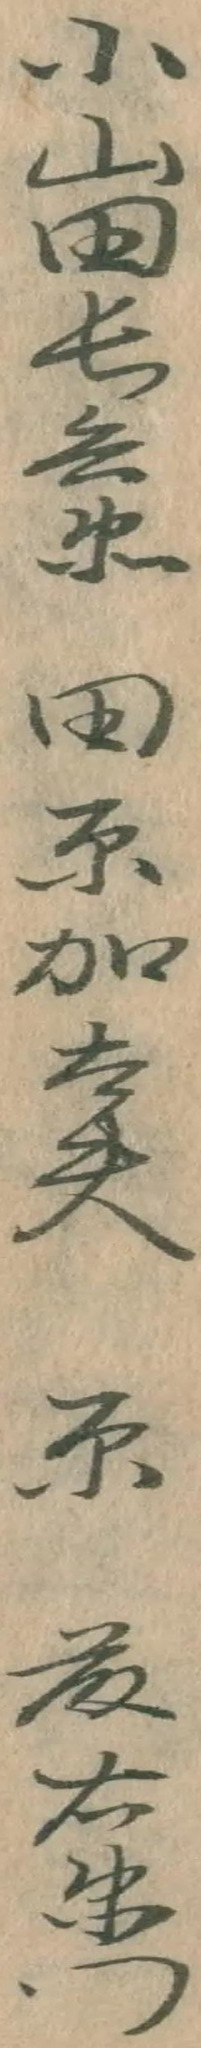小山田長兵衛田原加太夫原藤右衛門
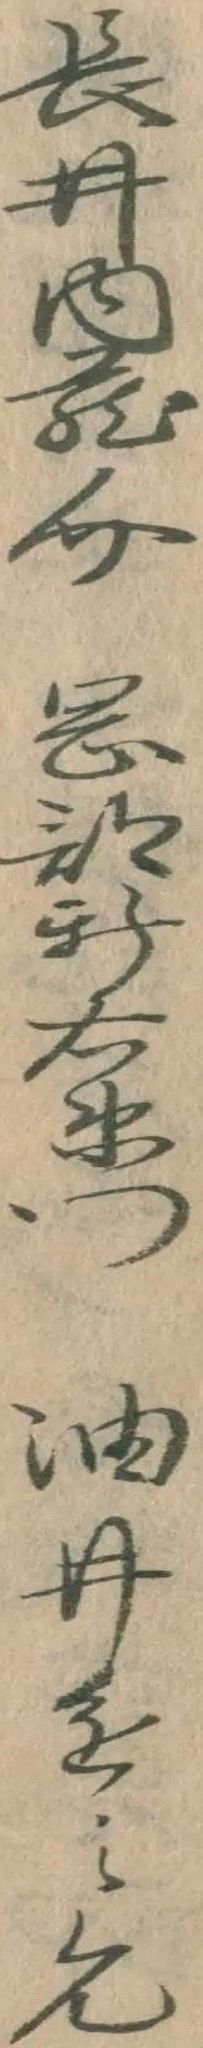長井内蔵介岡部新右衛門油井進之允
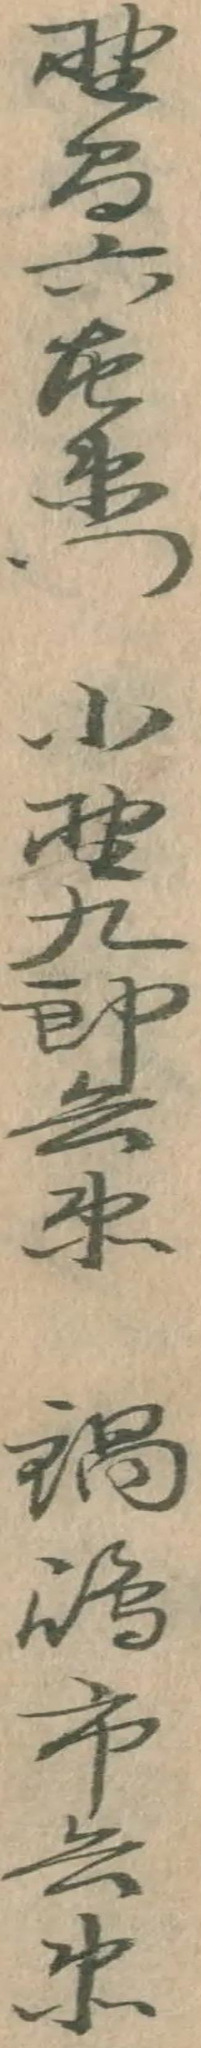野間六左衛門小野九郎兵衛鍋島市兵衛
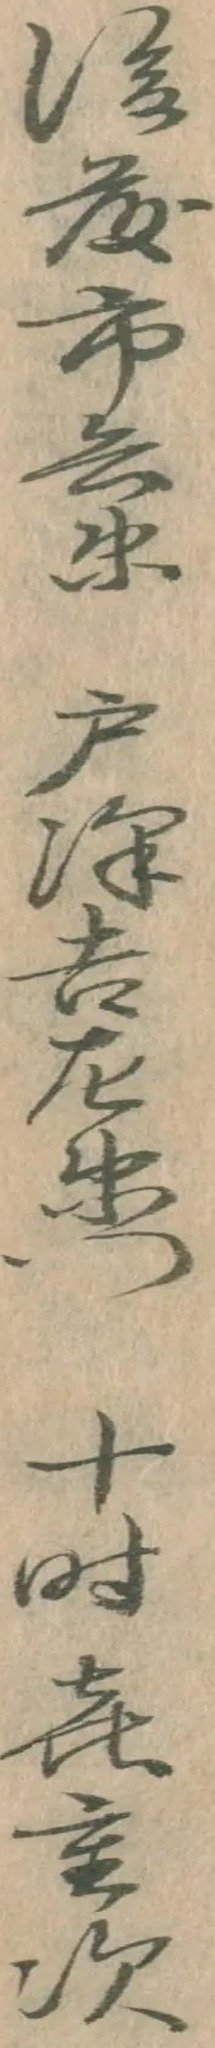後藤市兵衛戸沢吉左衛門十時喜重次

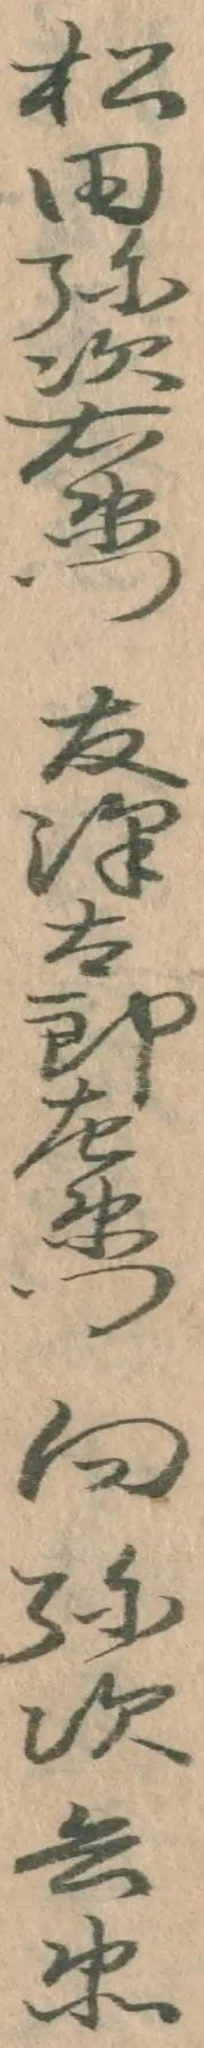松田弥次右衛門友沢太郎左衛門向弥次兵衛
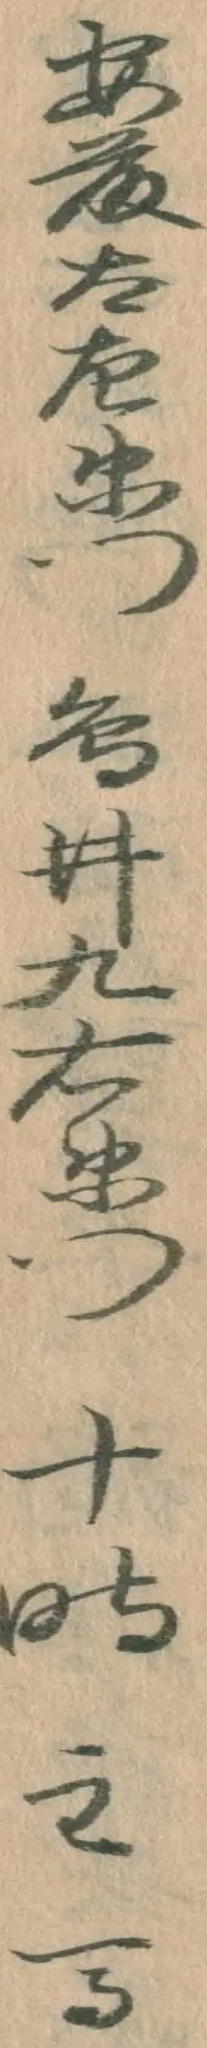安藤太左衛門鳥井九右衛門十時主馬
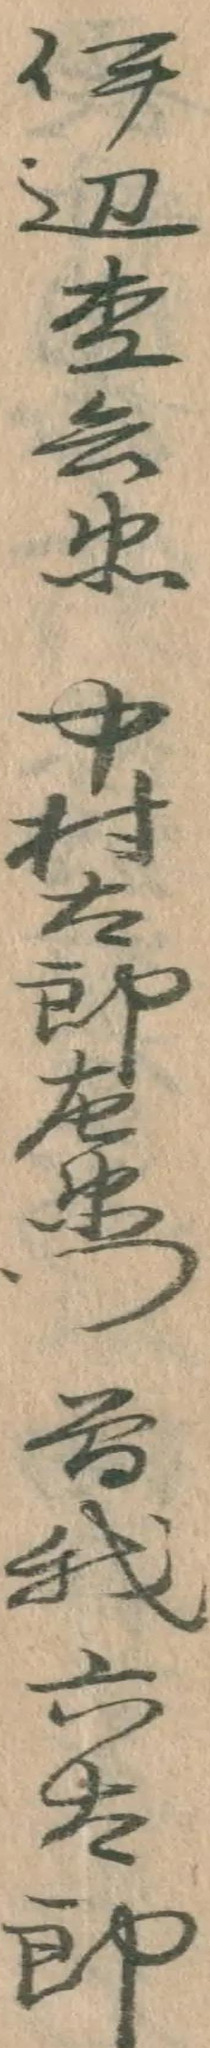伊辺杢兵衛中村太郎左衛門曽我六太郎
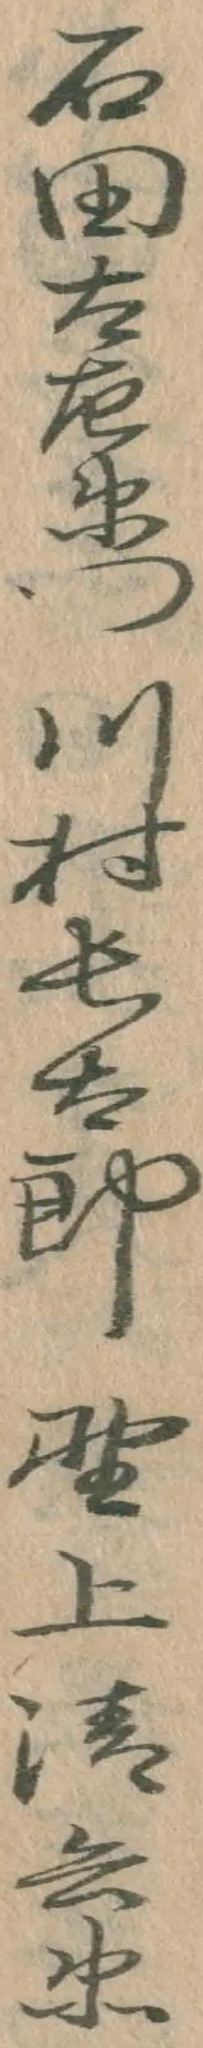石田太左衛門川村長太郎野上清兵衛
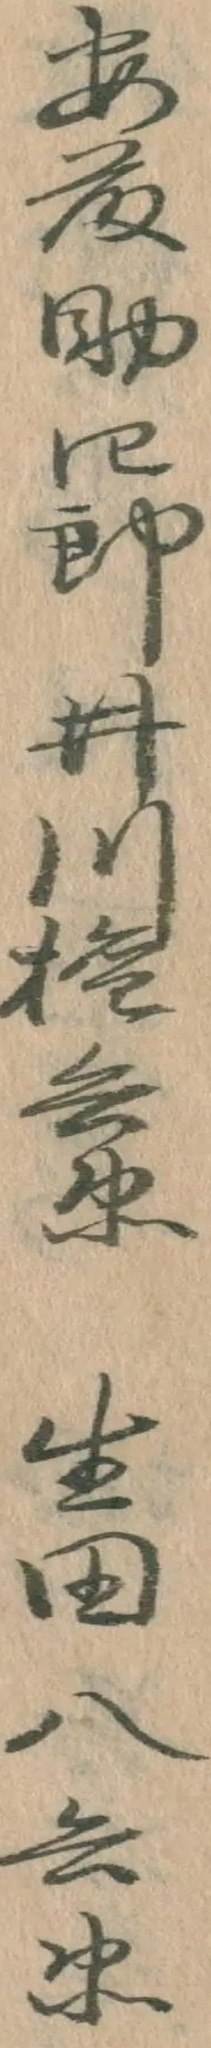安藤助四郎井川権兵衛生田八兵衛
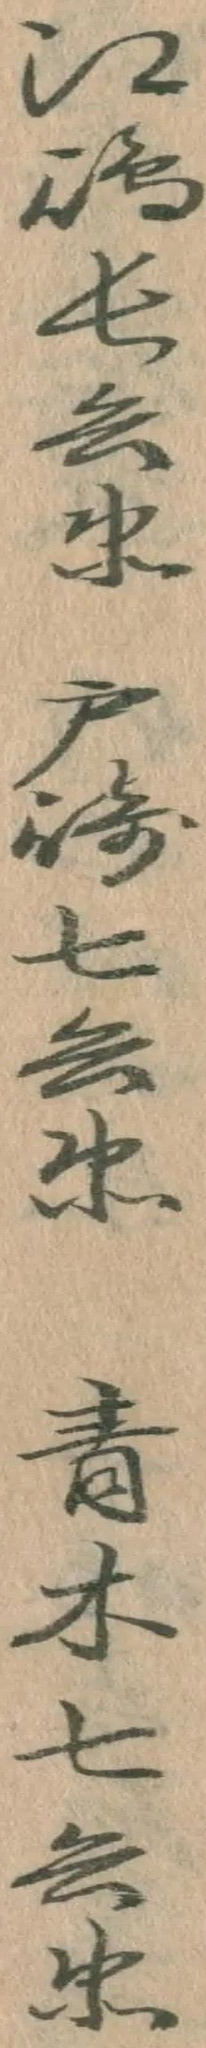江崎長兵衛戸崎七兵衛青木七兵衛
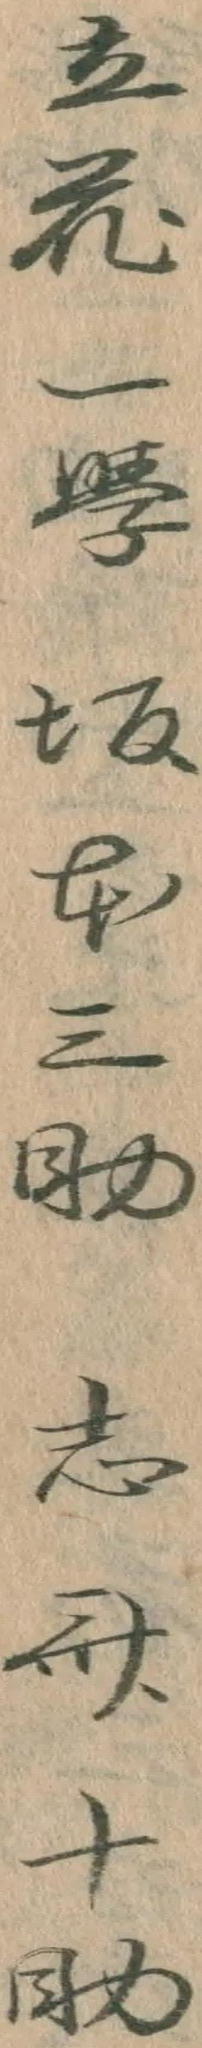立花一学坂本三助志斎十助
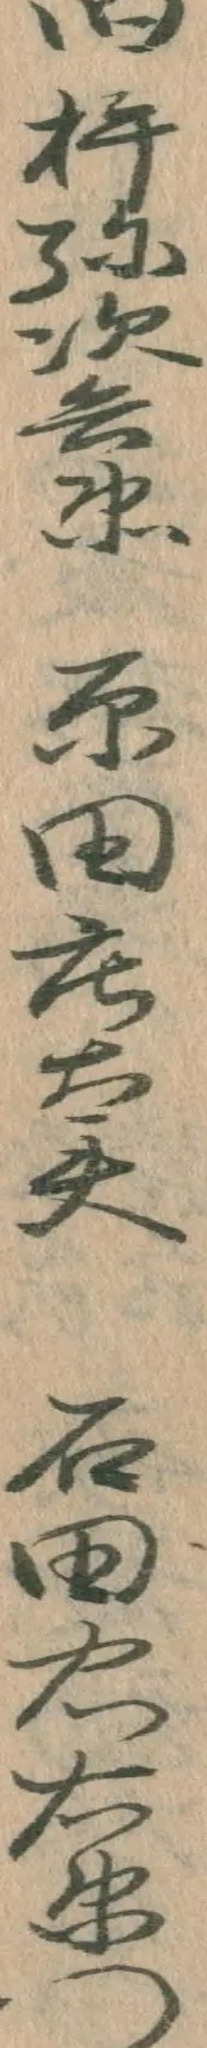旧杵弥次兵衛原田庄太夫石田忠右衛門
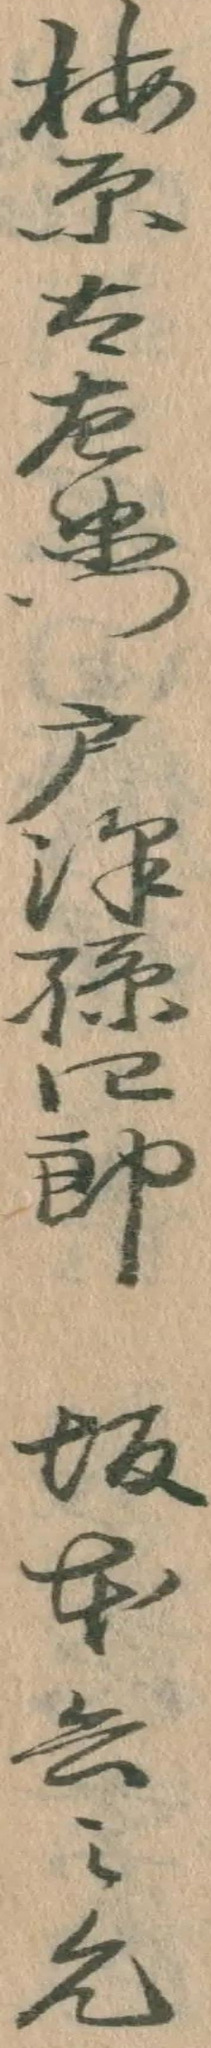梅原太左衛門戸沢孫四郎坂本兵之允
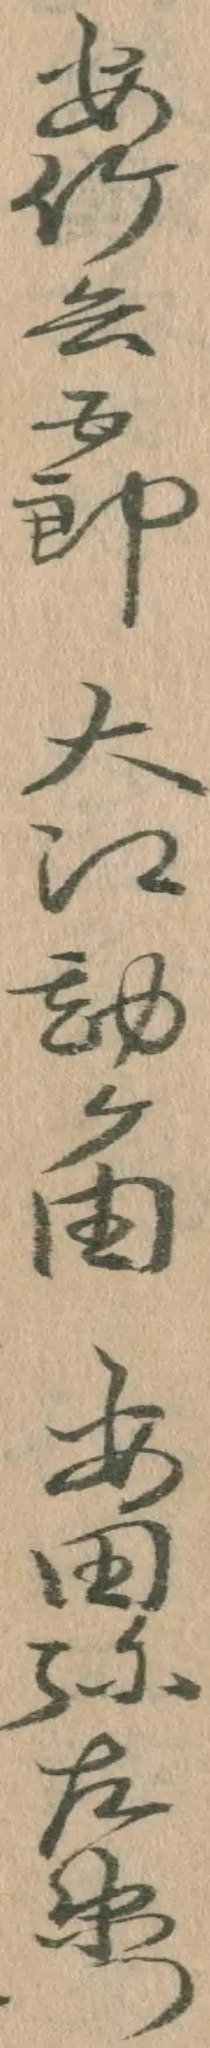安竹兵五郎大江勘け由安田弥左衛門
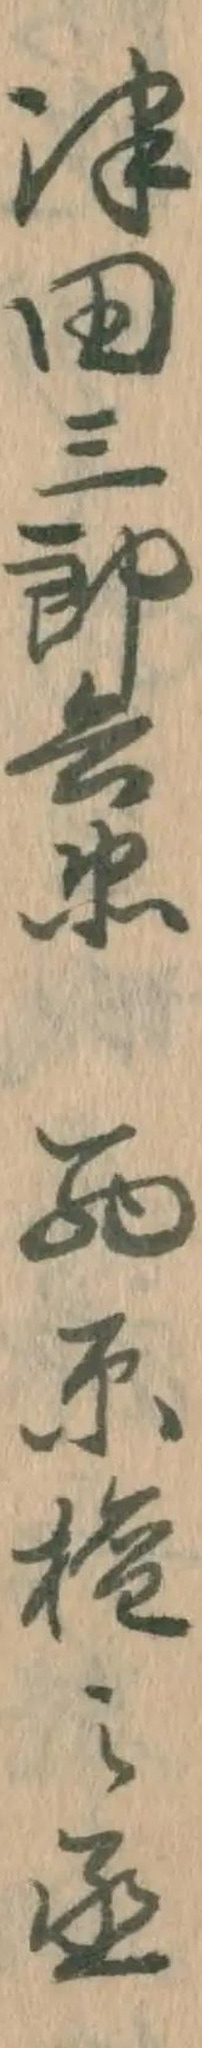津田三郎兵衛西原権之丞
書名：切支丹御退治記 49巻. [4]
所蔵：国立国会図書館 National Diet Library, JAPAN
